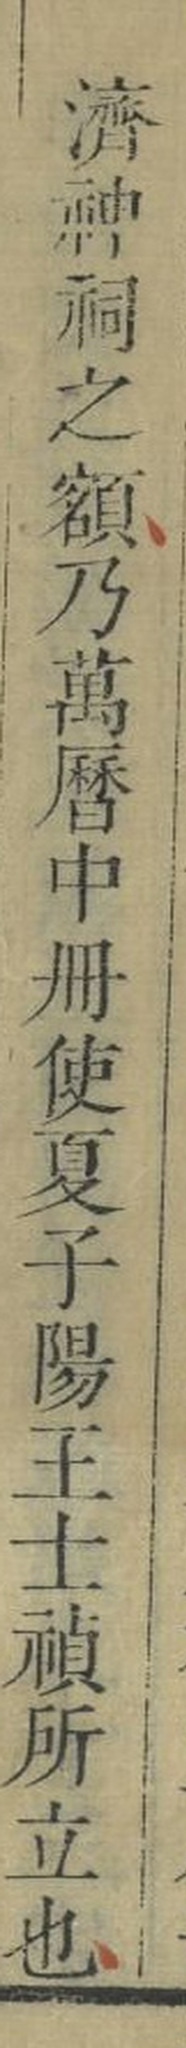濟神祠之額乃萬曆中冊使夏子陽王士禎所立也
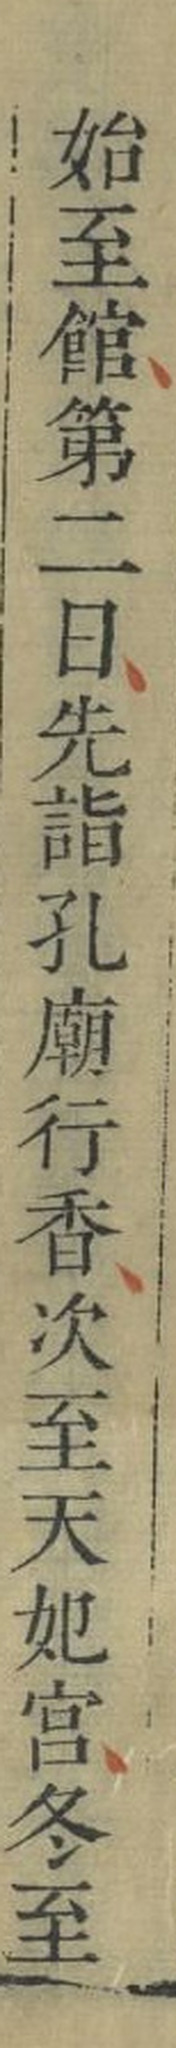始至館第二日先詣孔廟行香次至天妃宫冬至
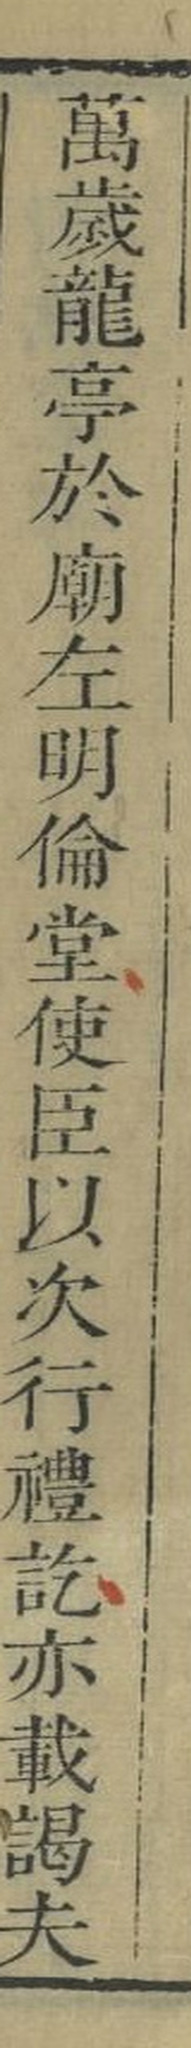萬歲龍亭於廟左明倫堂使臣以次行禮訖亦載謁夫
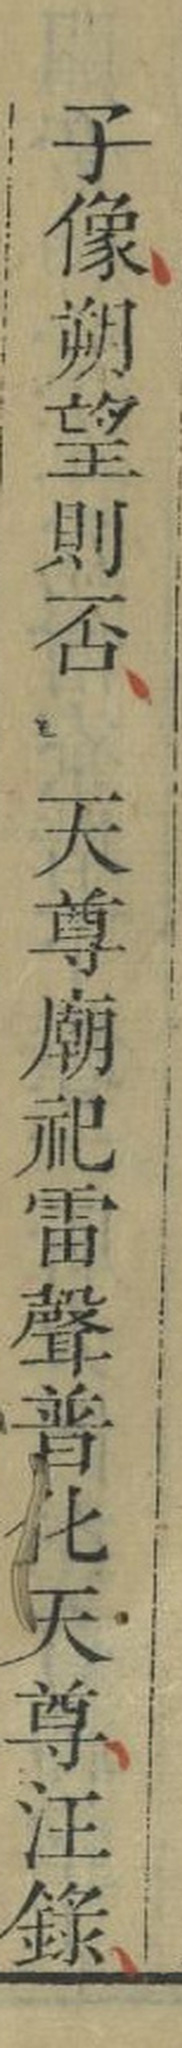子像朔望則否天尊廟祀雷聲普化天尊汪錄
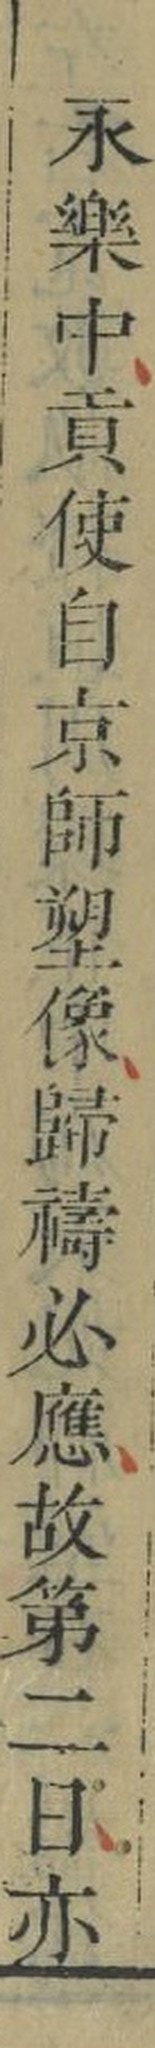永樂中貢使自京師塑像歸禱必應故第二日亦
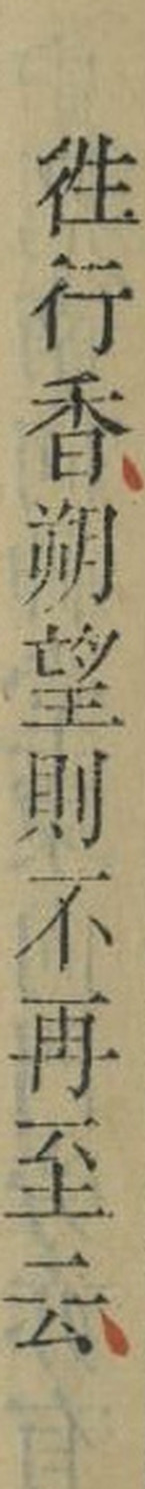徃行香朔望則不再至云

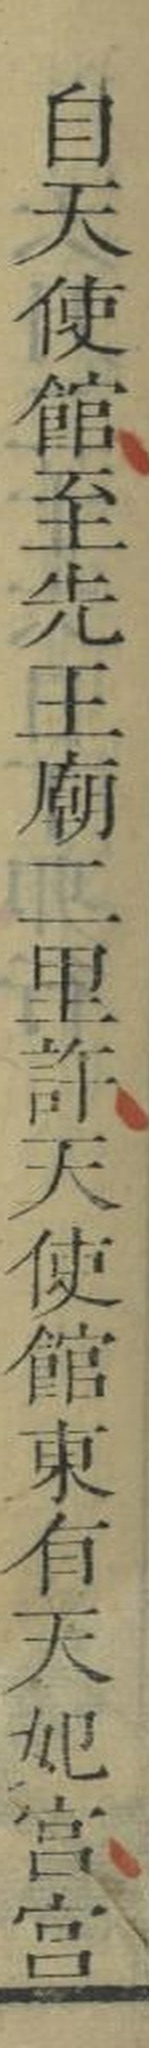自天使館至先王廟二里許天使館東有天妃宫宫
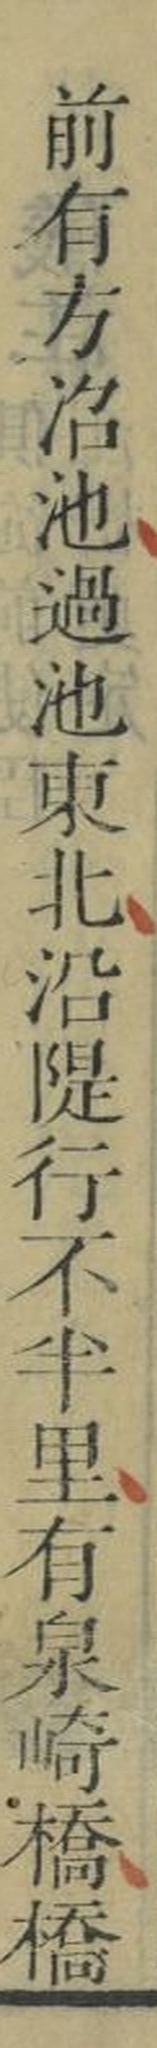前有方沼池過池東北沿隄行不半里有泉崎橋橋
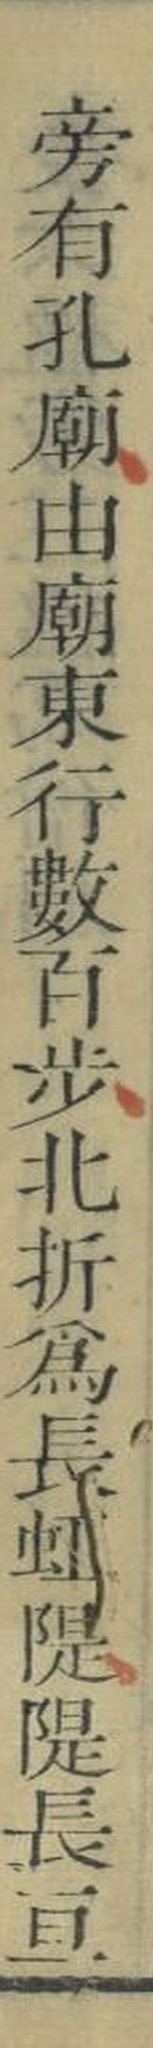旁有孔廟由廟東行數百步北折爲長虹隄隄長亘
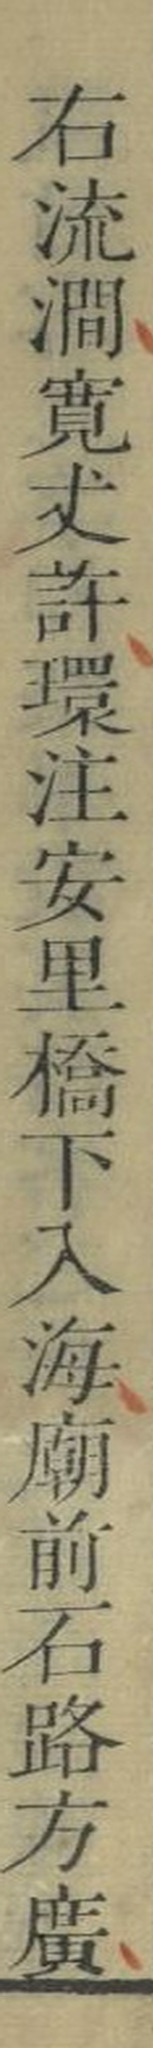右流澗寛丈許環注安里橋下入海廟前石路方廣
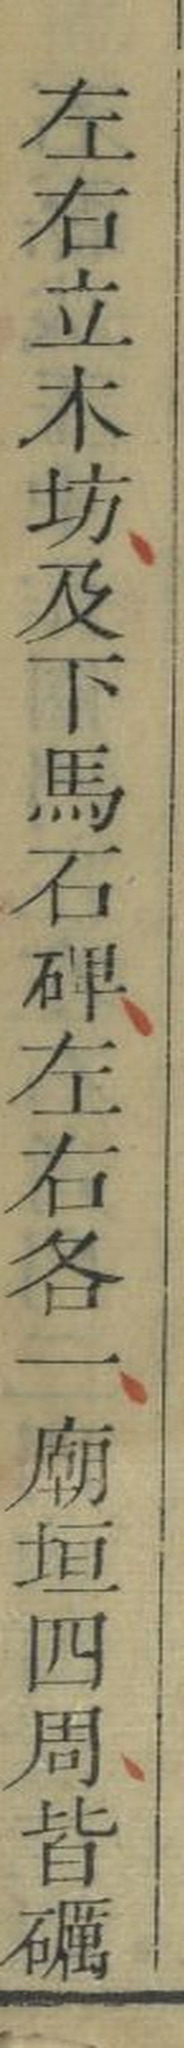左右立木坊及下馬石碑左右各一廟垣四周皆礪

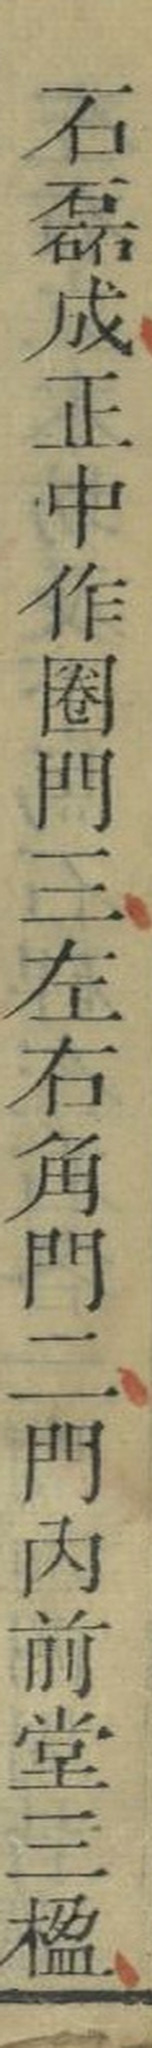石磊成正中作圏門三左右角門二門内前堂三楹
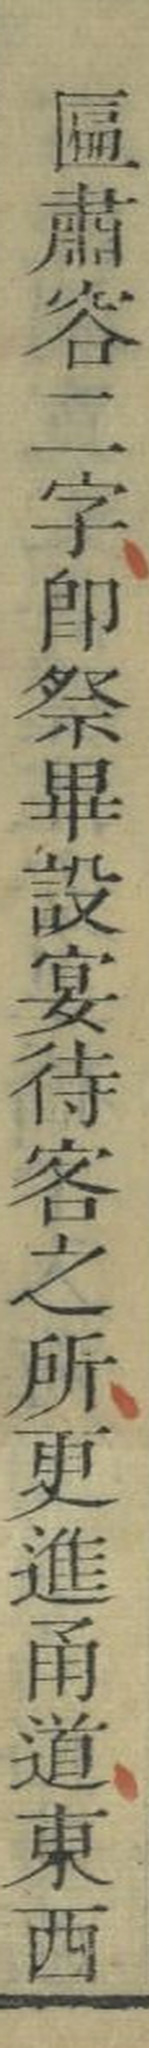匾肅容二字卽祭畢設宴待客之所更進甬道東西
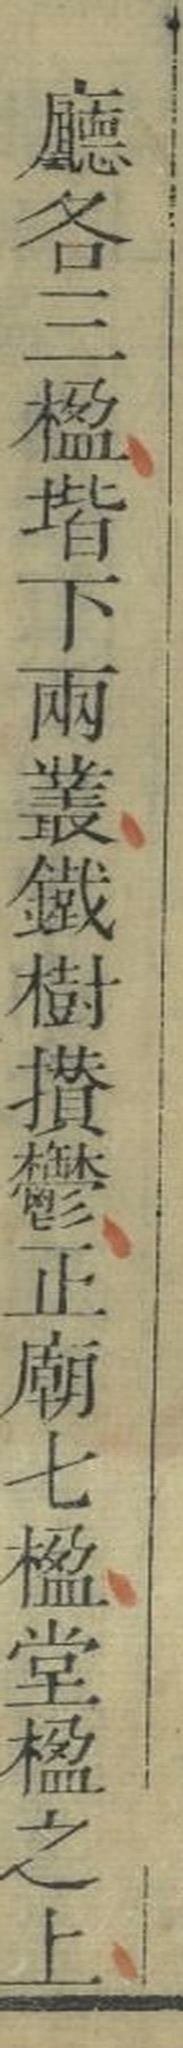廳各三楹堦下兩叢鐵樹攅鬱正廟七楹堂楹之上
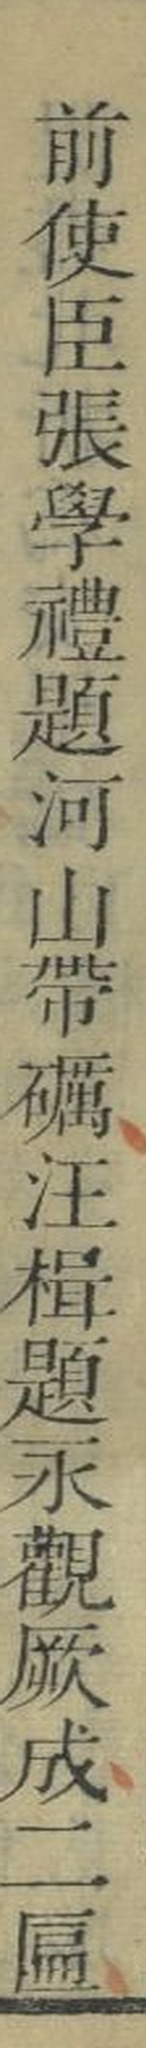前使臣張學禮題河山帶礪汪楫題永觀厥成二匾
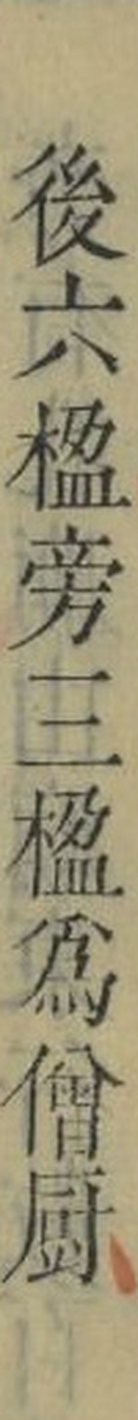後六楹旁三楹爲僧厨
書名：中山伝信録 巻一、巻二
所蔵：University of the Ryukyus Library
